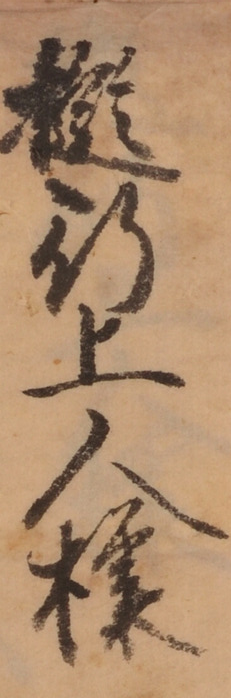遊行上人様
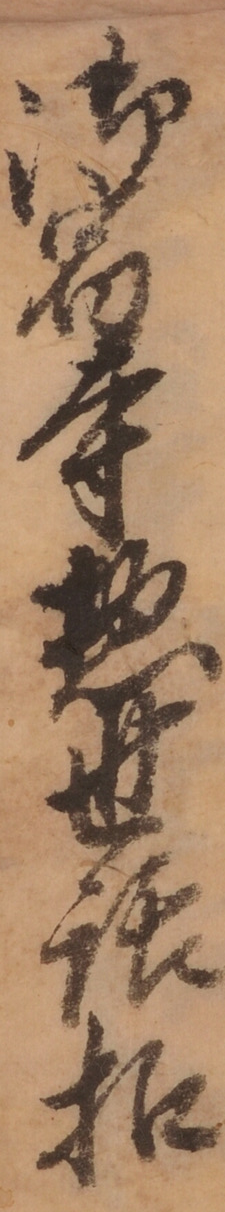御宿寺惣世話控
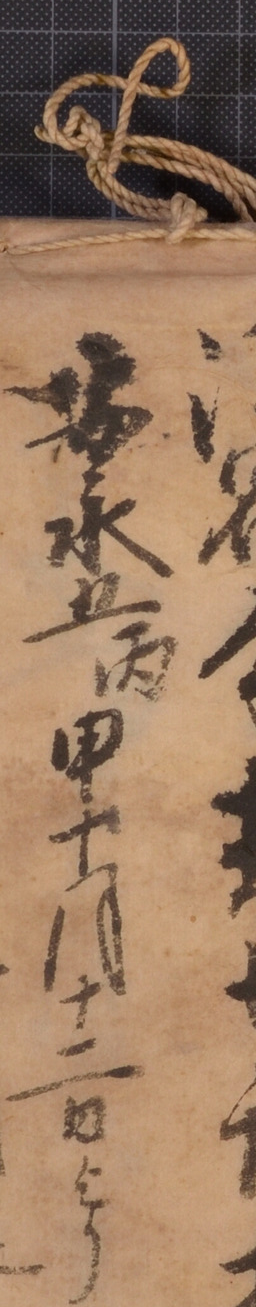安永五丙甲十月十二日より
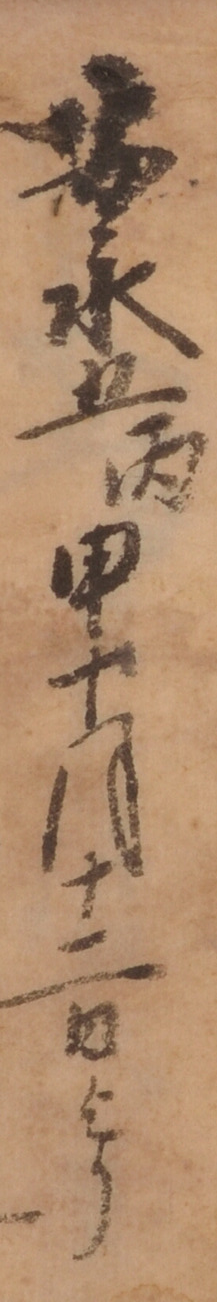安永五丙甲十月十二日より
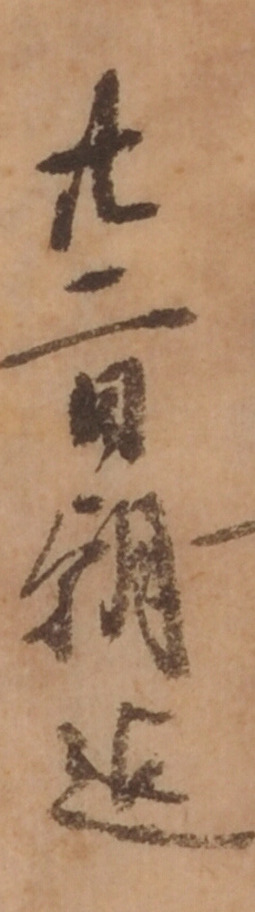廿二日朝迄

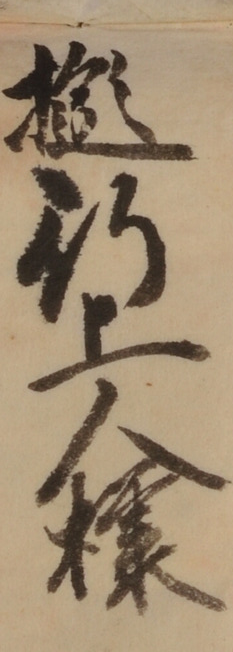遊行上人様
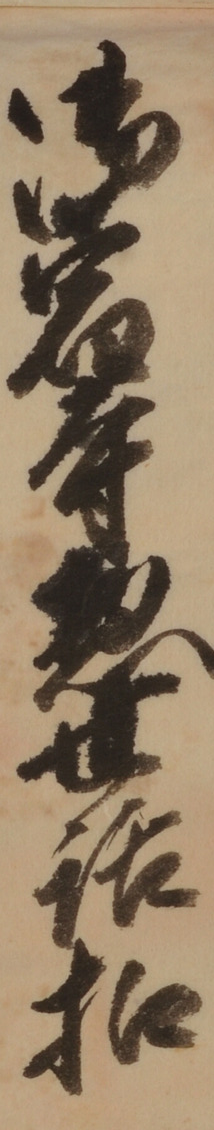御宿寺惣世話控
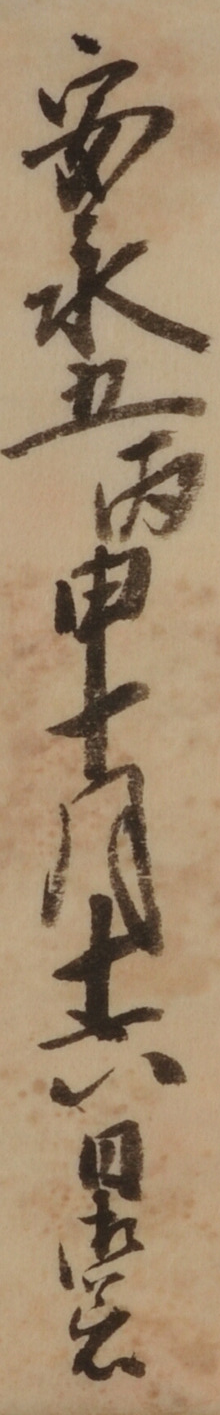安永五丙甲十月十六日御着
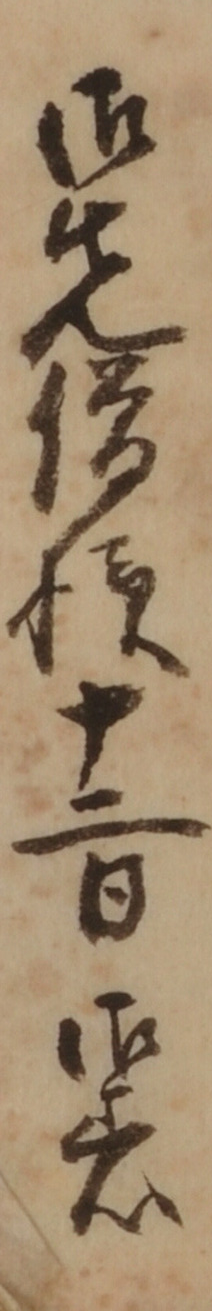御先僧様十二日御着

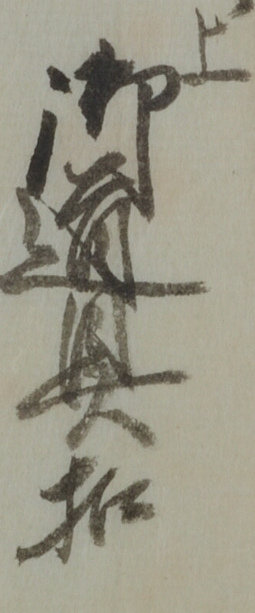御道具控
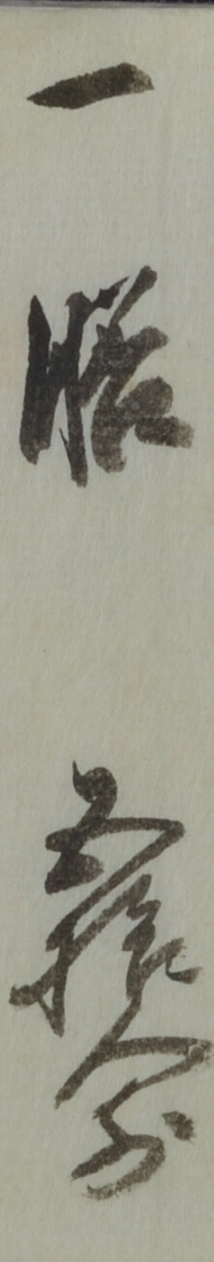一膳五拾人前
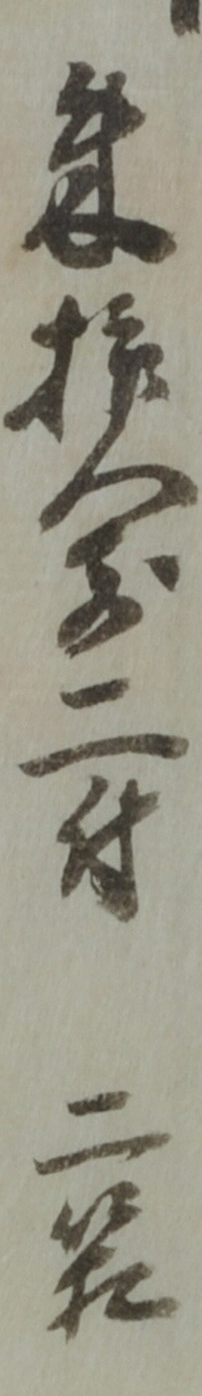朱拾人前二付二箱
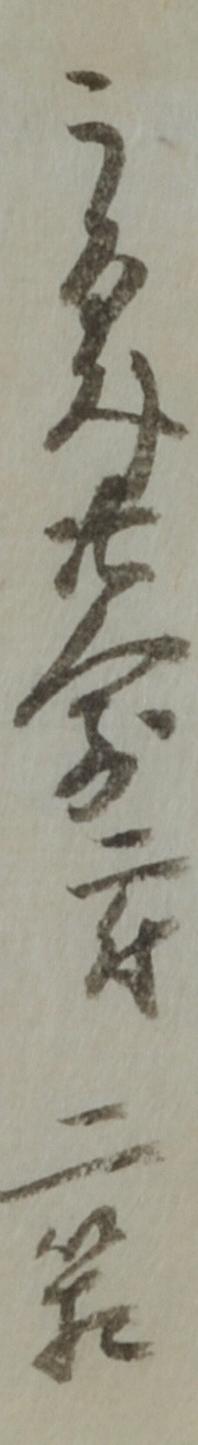うるみ廿人前二付二箱

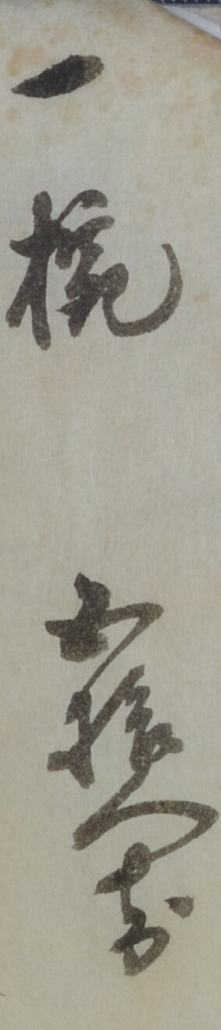一椀五拾人前
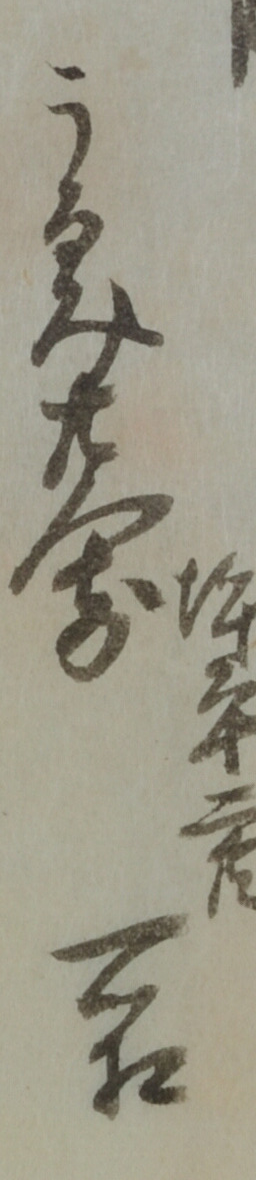うるみ廿人前一箱
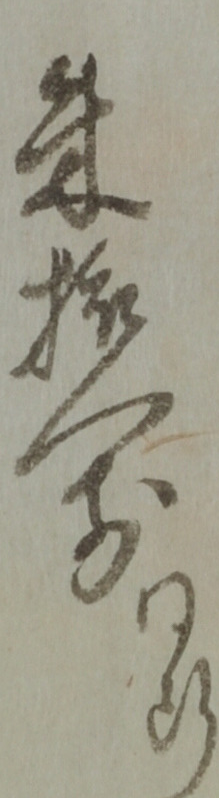朱拾人前一箱
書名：遊行上人様御宿寺惣世話控
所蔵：伊那市立高遠町図書館・合同会社AMANE
